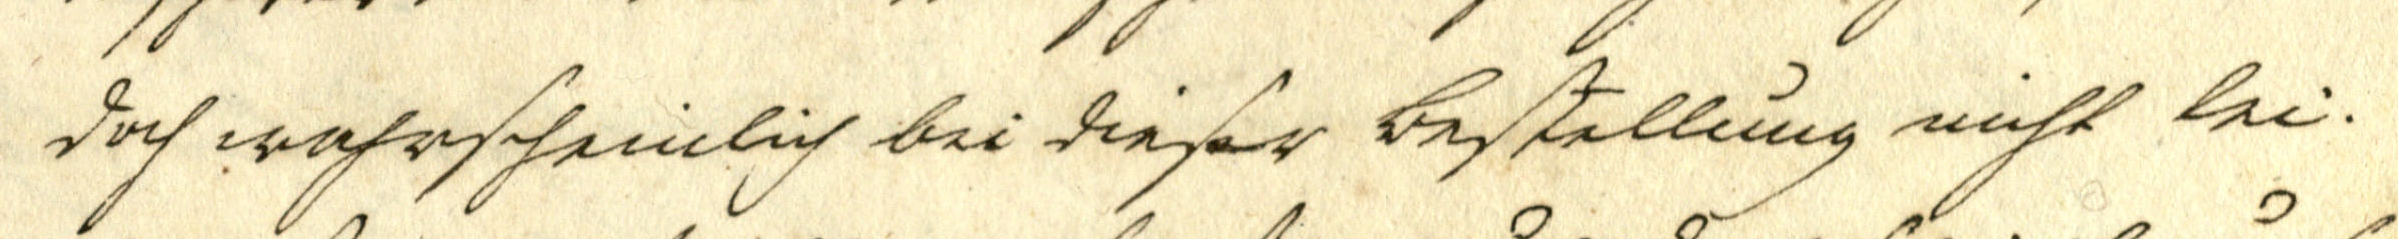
doch wahrscheinlich bei dieser Bestellung nicht lei¬
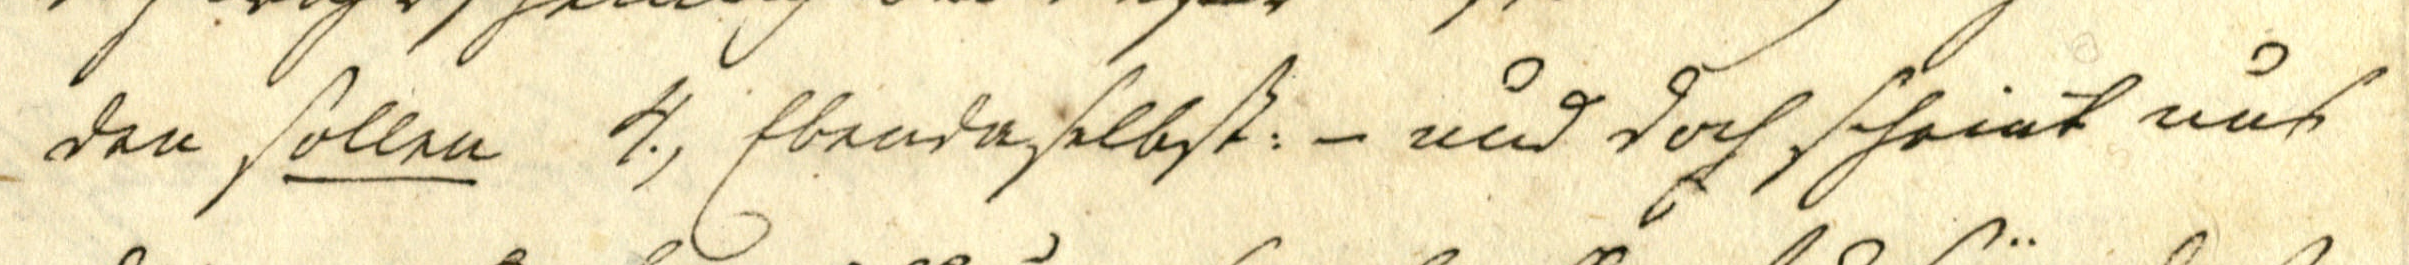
den sollen 4, Ebendaselbst: und doch scheint nur
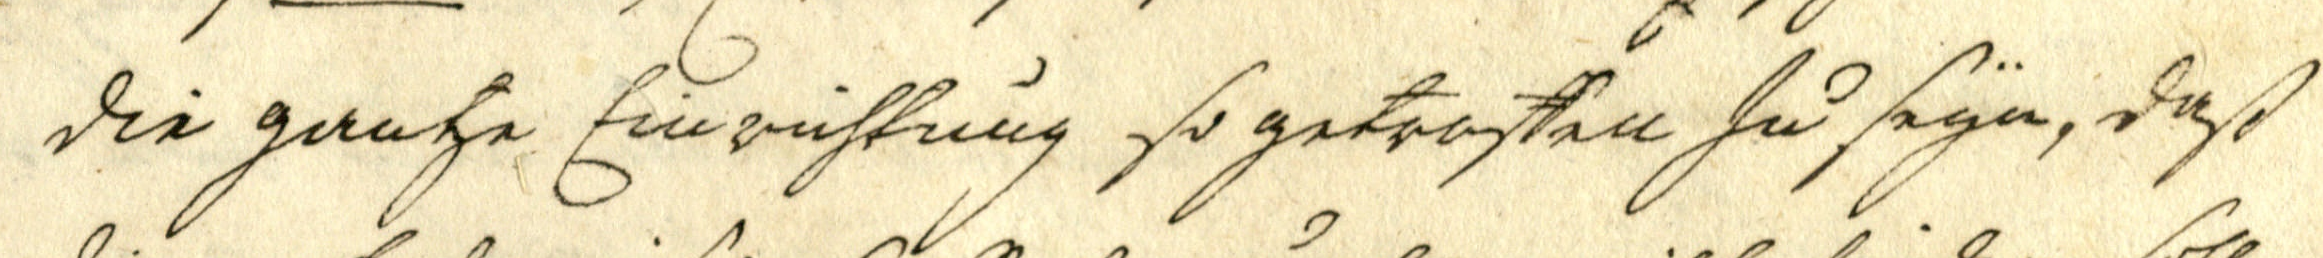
die gantze Einrichtung so getroffen zu seÿn, daß
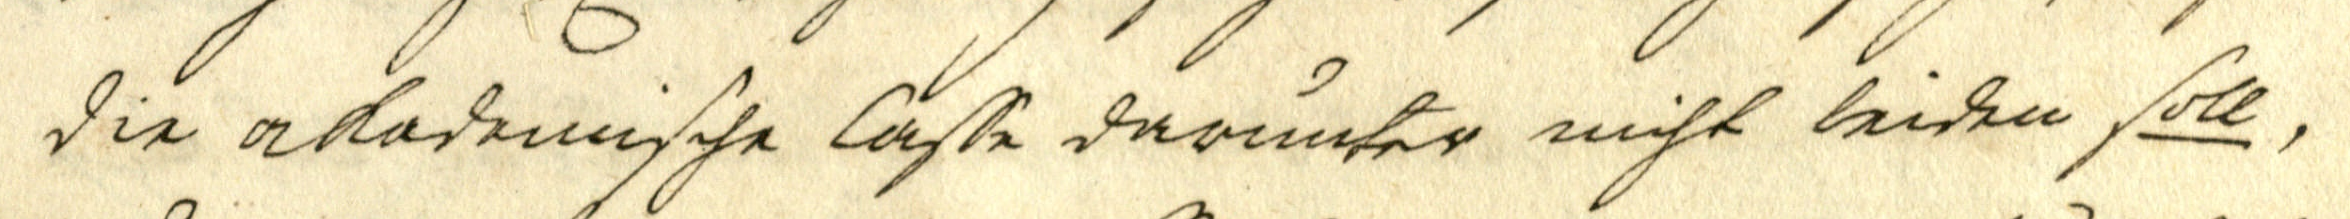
die akademische Casse darunter nicht leiden soll,
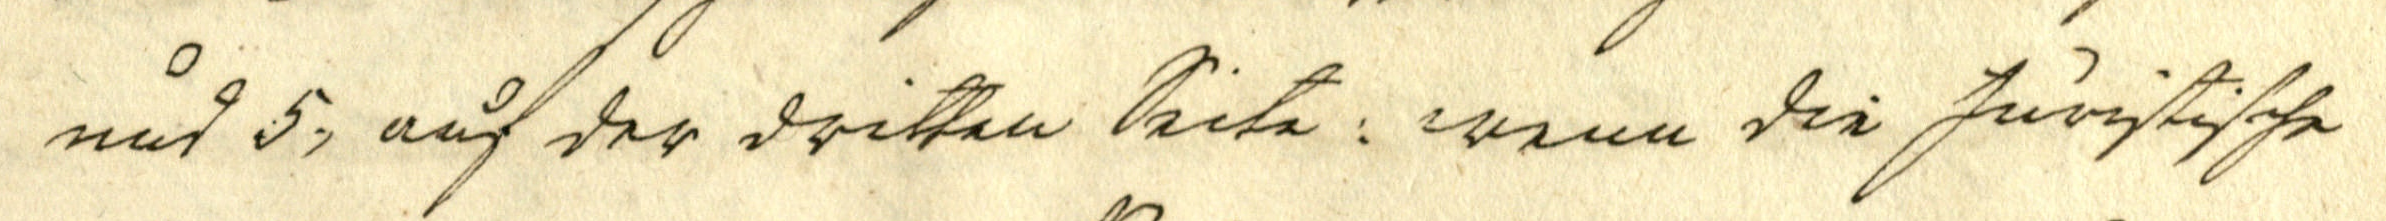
und 5, auf der dritten Seite: wenn die Juristische
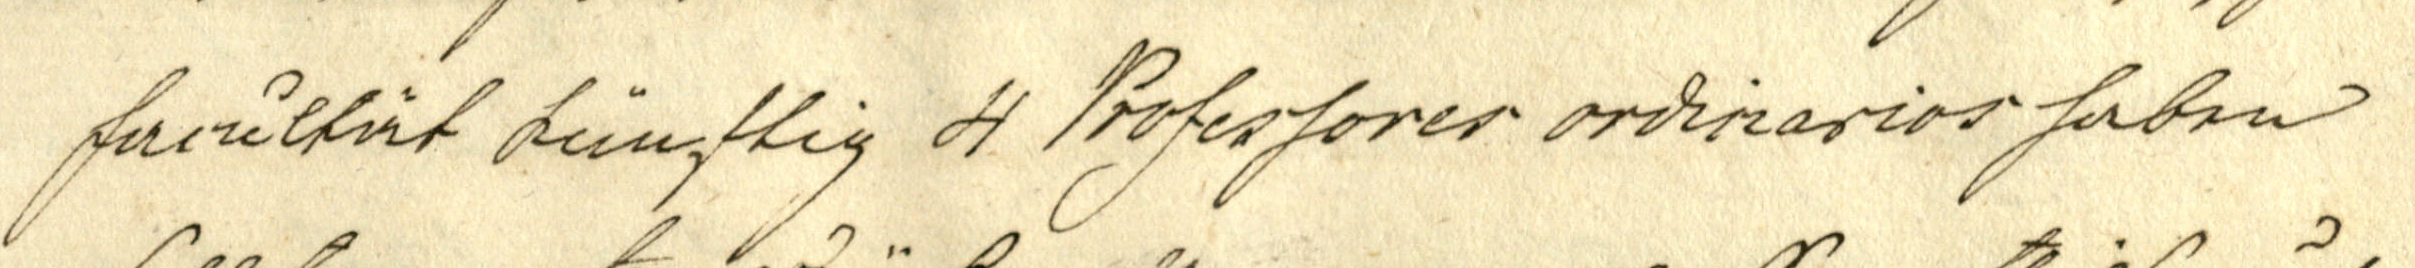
facultät künftig 4 Professores ordinarios haben
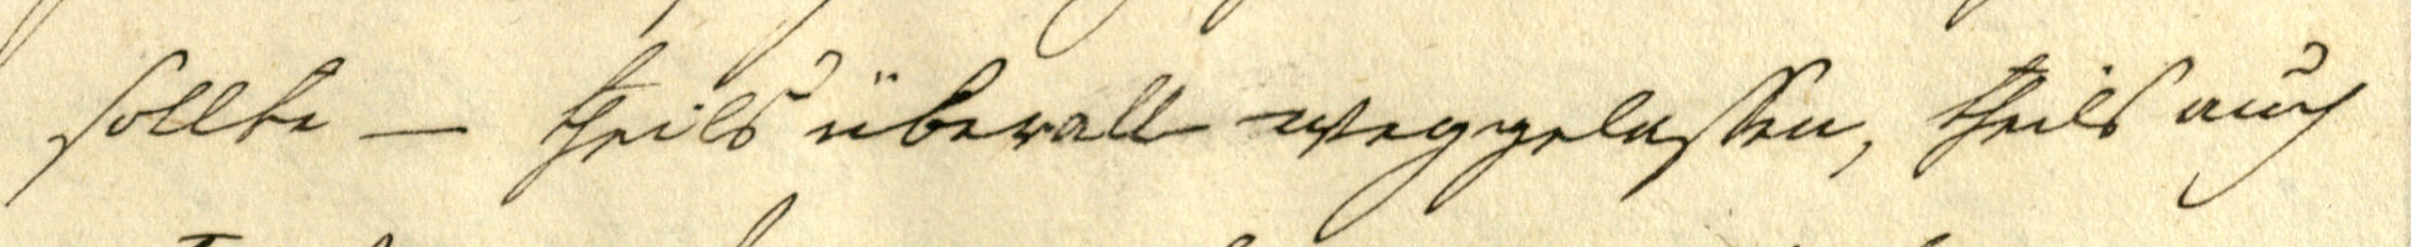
sollte theils überall weggelassen, theils auch
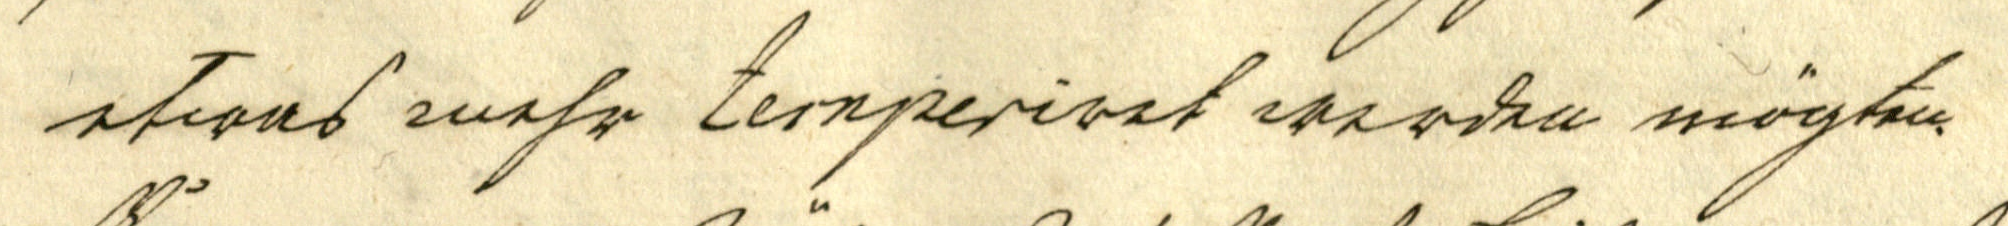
etwas mehr temperiret werden mögten.
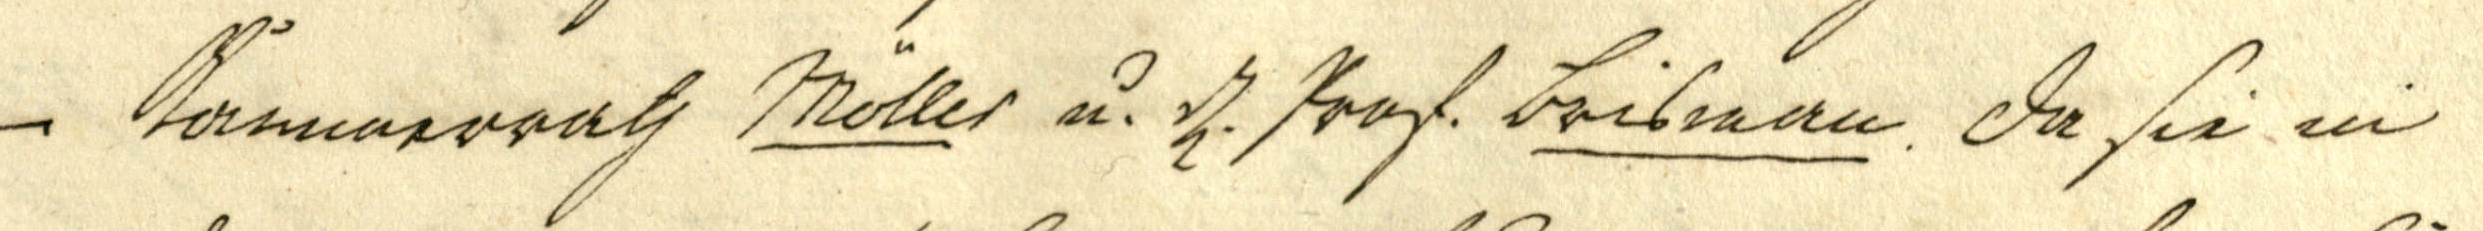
Kammerrath Möller und dh. Prof. Brisman. Da sie in
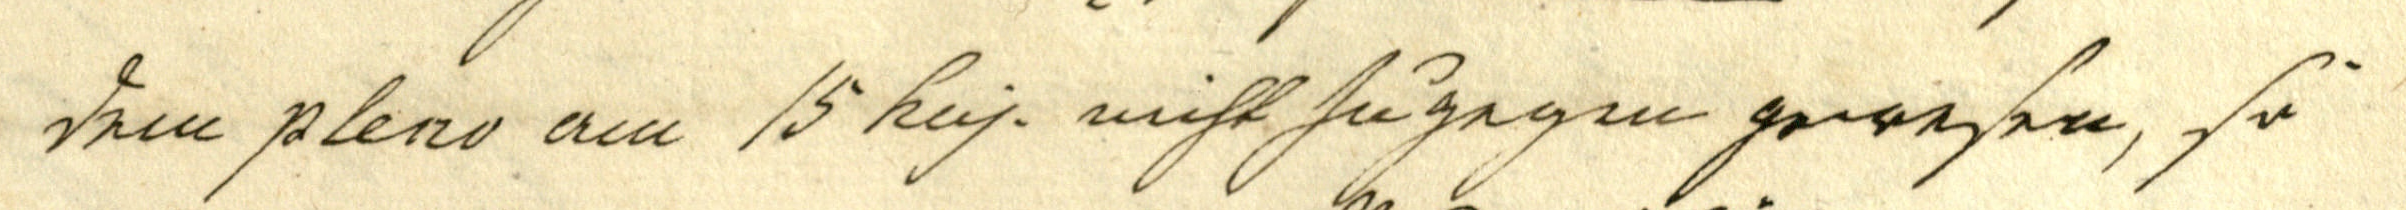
dem pleno am 15. huj. nicht zugegen gewesen, so
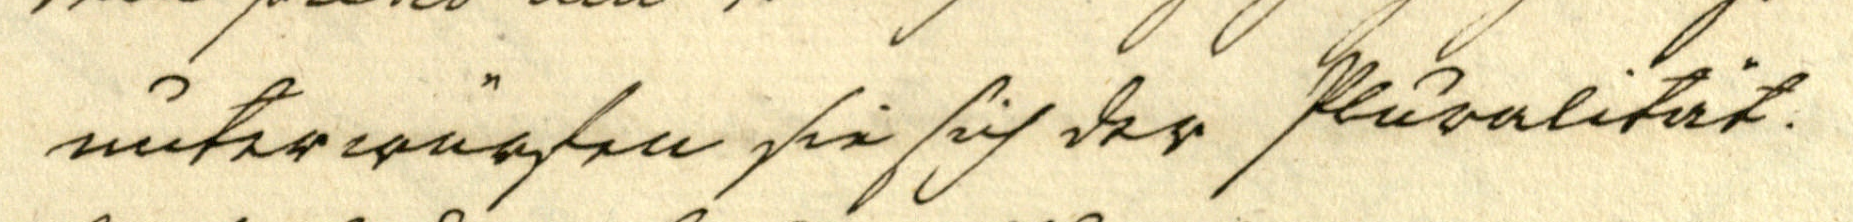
unterwürfen sie sich der Pluralität.
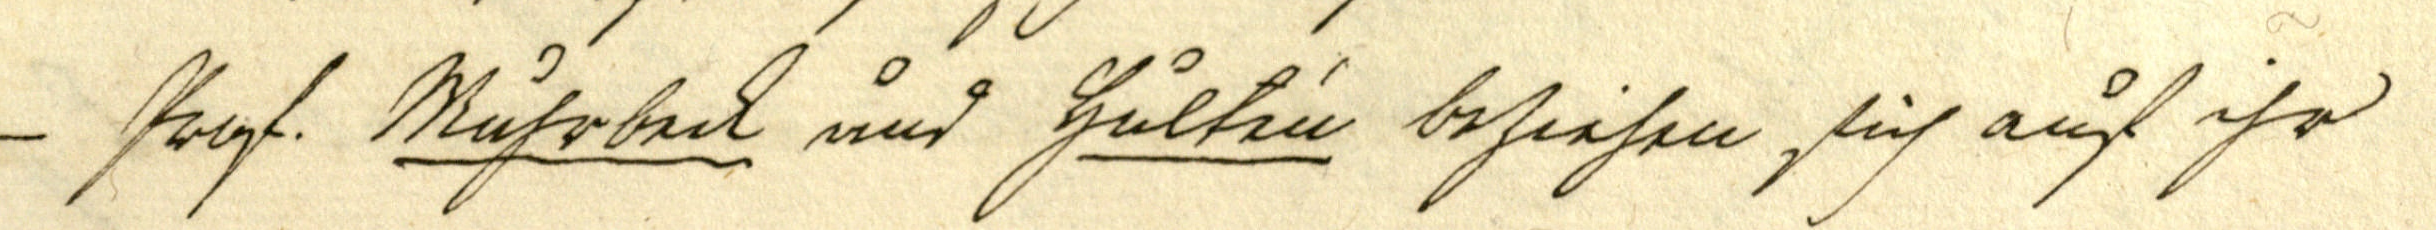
Prof. Muhrbeck und Hultèn beziehen sich auf ihr
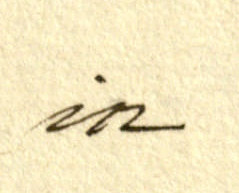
in
